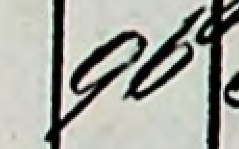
96
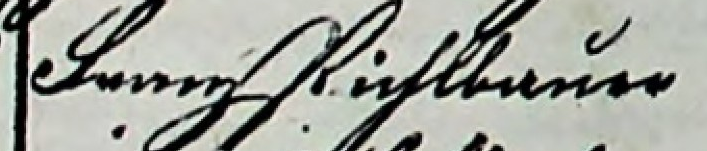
Franz Pichlbauer
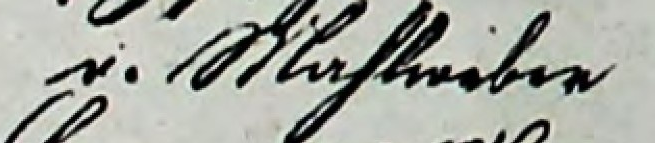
v. Mahlweber
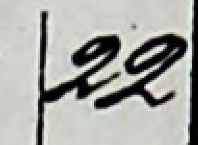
22
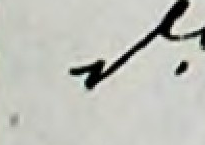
do
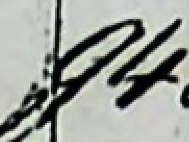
94
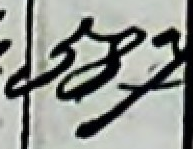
587
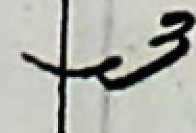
3
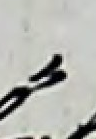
„
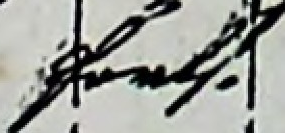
Ferth.
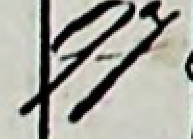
97
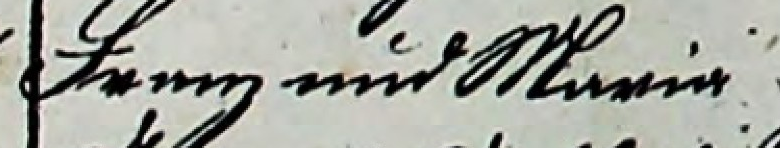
Franz und Maria
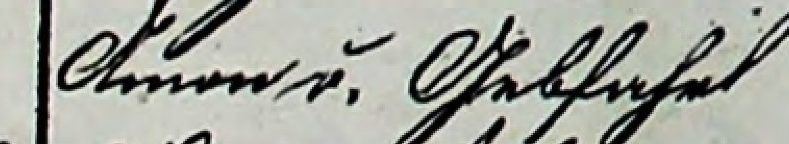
Amon u. Gebfahrl
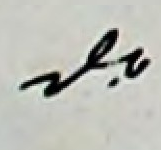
do
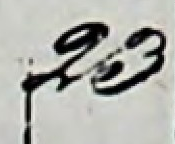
23
